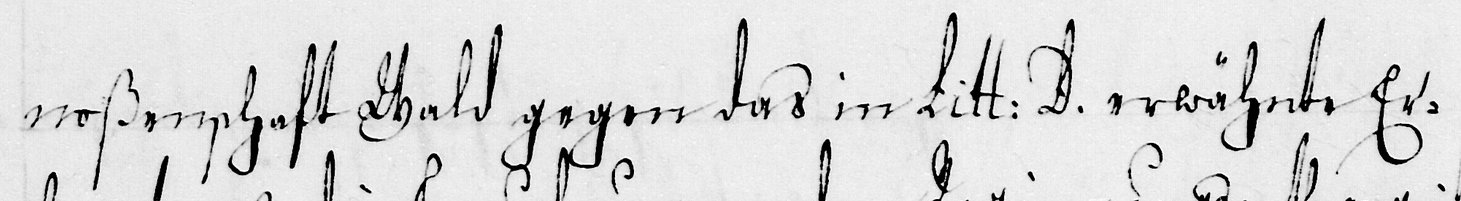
noßenschaft Wald gegen das in Litt: D. erwähnte Er¬
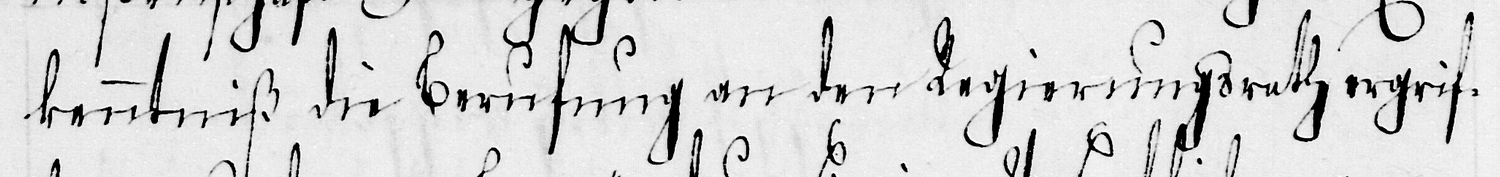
kenntniß die Berufung an den Regierungsrath ergrif¬
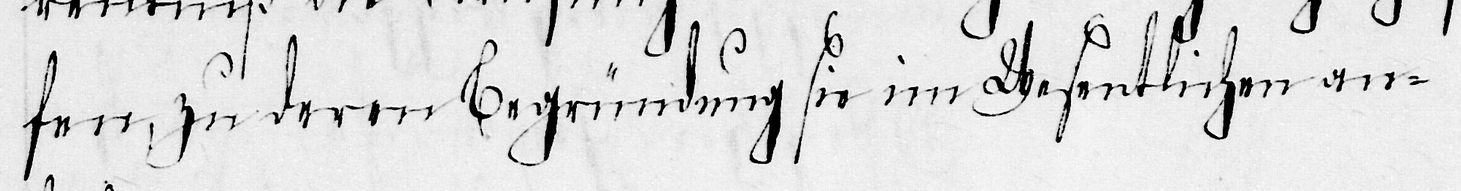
fen, zu deren Begründung sie im Wesentlichen an¬
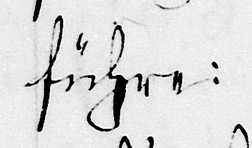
führe:
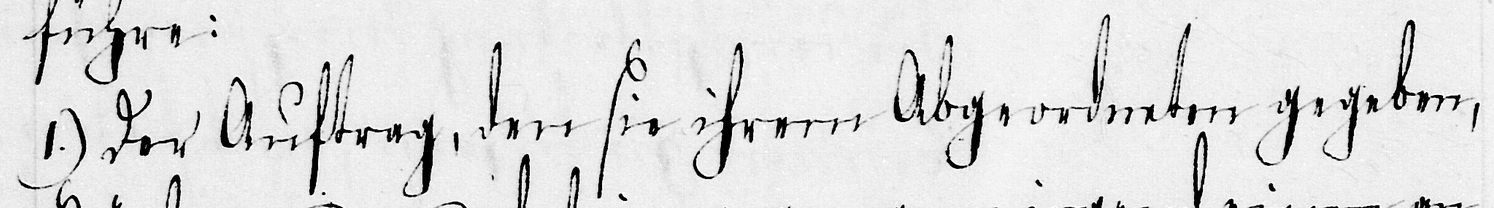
1.) Der Auftrag, den sie ihrem Abgeordneten gegeben,
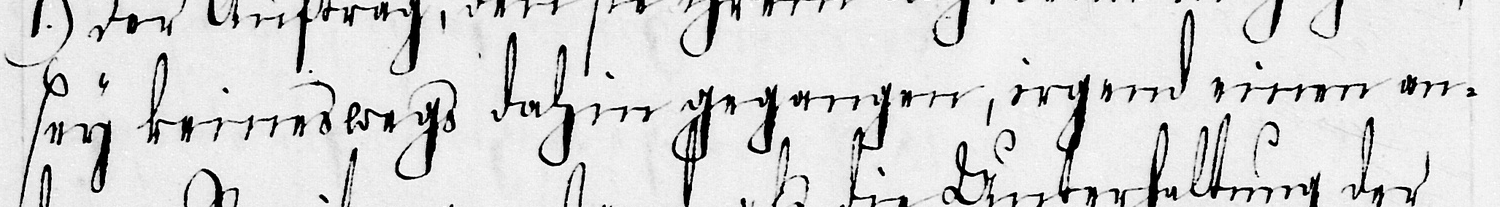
sey keineswegs dahin gegangen, irgend einen an¬
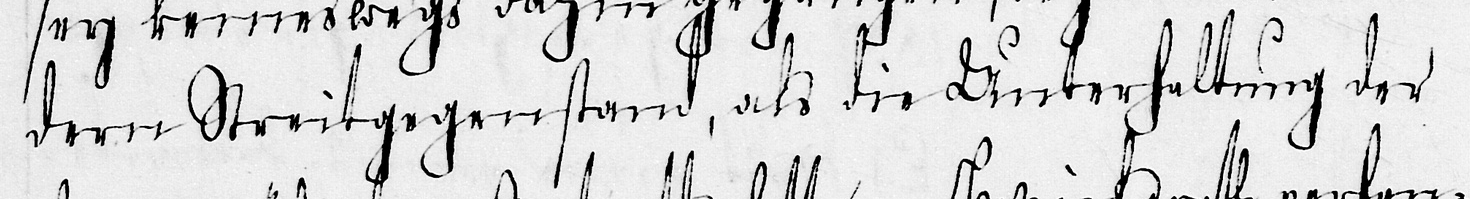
dern Streitgegenstand, als die Unterhaltung der
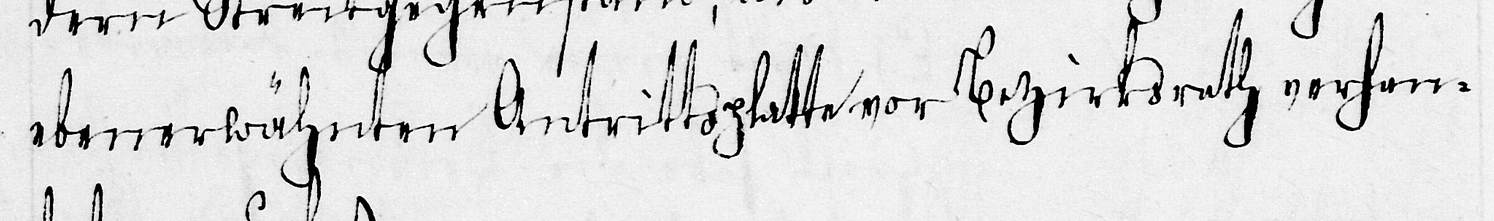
ebenerwähnten Antrittsplatte vor Bezirksrath verhan¬
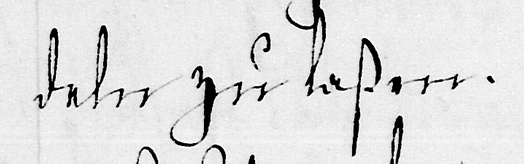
deln zu laßen.
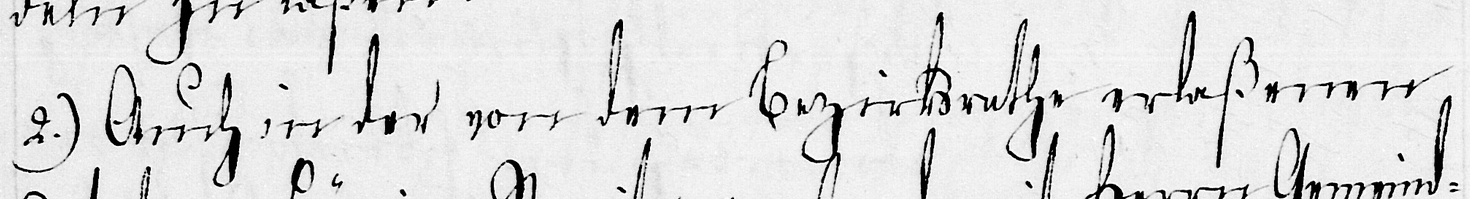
2.) Auch in der von dem Bezirksrathe erlaßenen
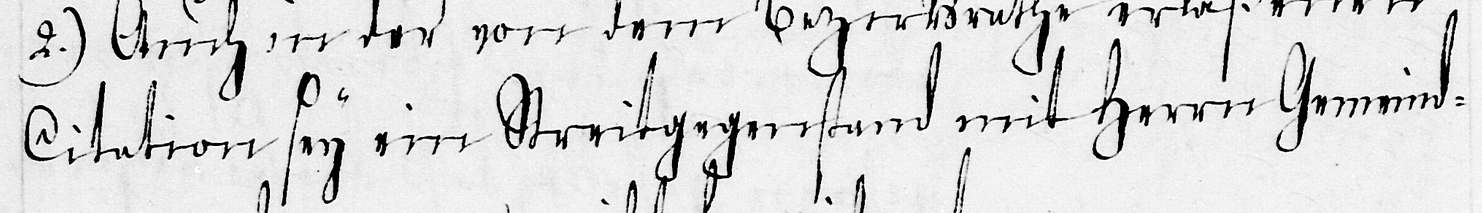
Citation sey ein Streitgegenstand mit Herrn Gemeind¬
